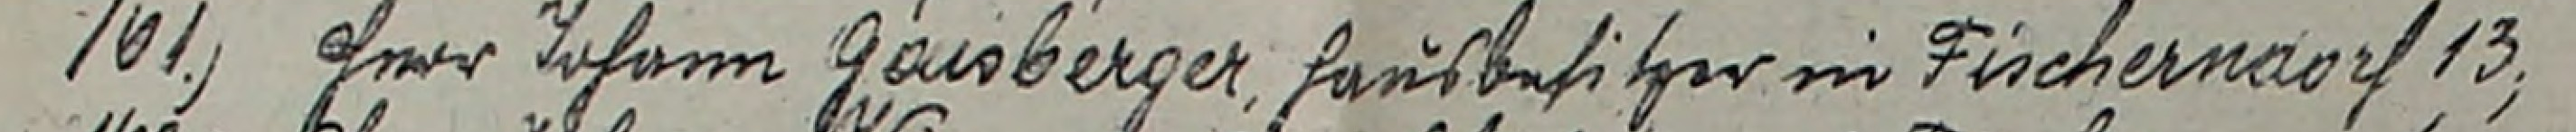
161.) Herr Johann Gaisberger, Hausbesitzer in Fischerndorf 13;
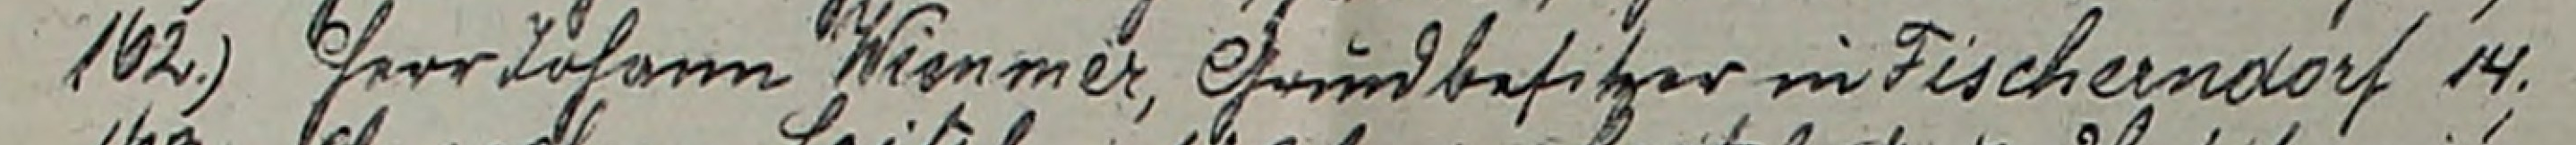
162.) Herr Johann Wimmer, Grundbesitzer in Fischerndorf 14;
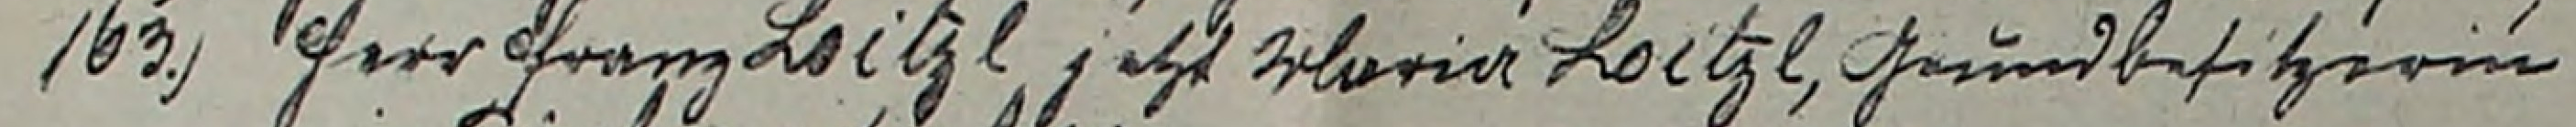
163.) Herr Franz Loitzl, jetzt Maria Loitzl, Grundbesitzerin
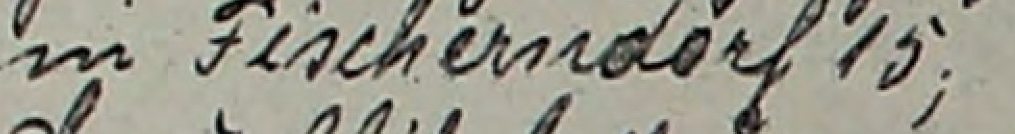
in Fischerndorf 15;
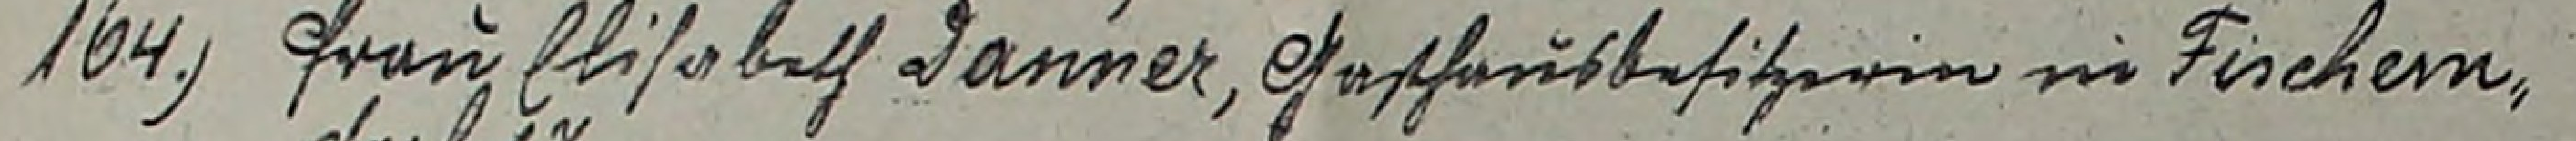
164.) Frau Elisabeth Danner, Gasthausbesitzerin in Fischern„
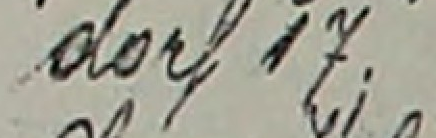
dorf 17;
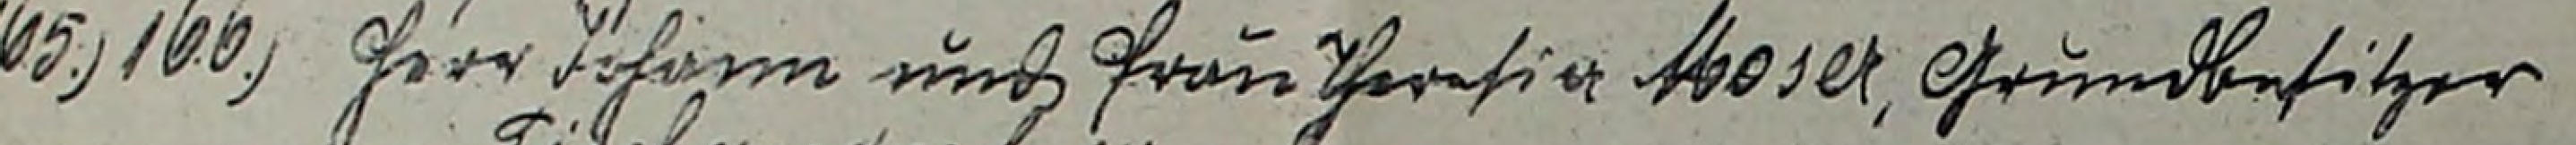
165.) 166.) Herr Johann und Frau Theresia Moser, Grundbesitzer
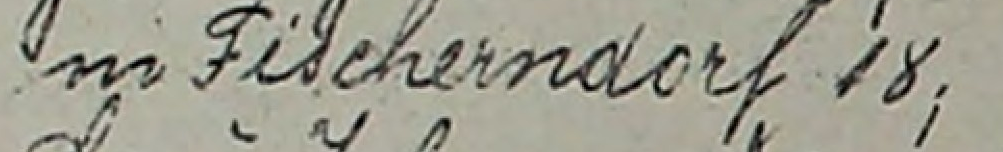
in Fischerndorf 18;
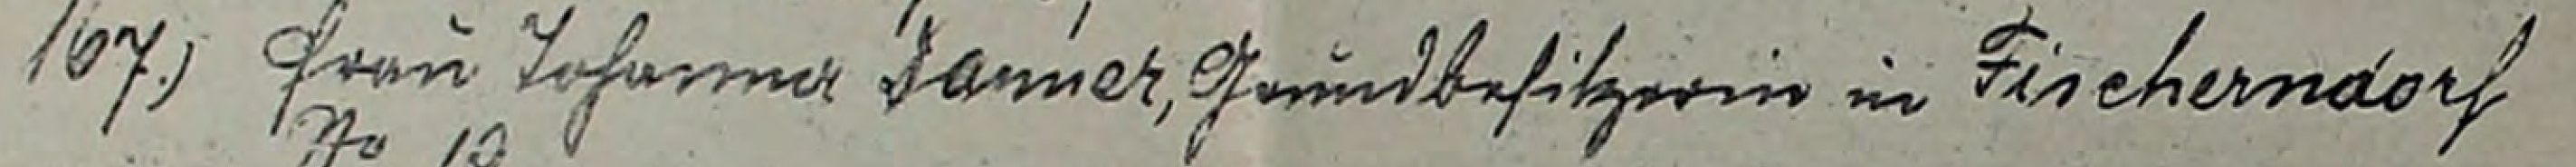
167.) Frau Johanna Danner, Grundbesitzerin in Fischerndorf
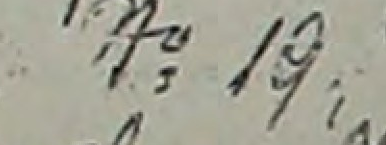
No 19;
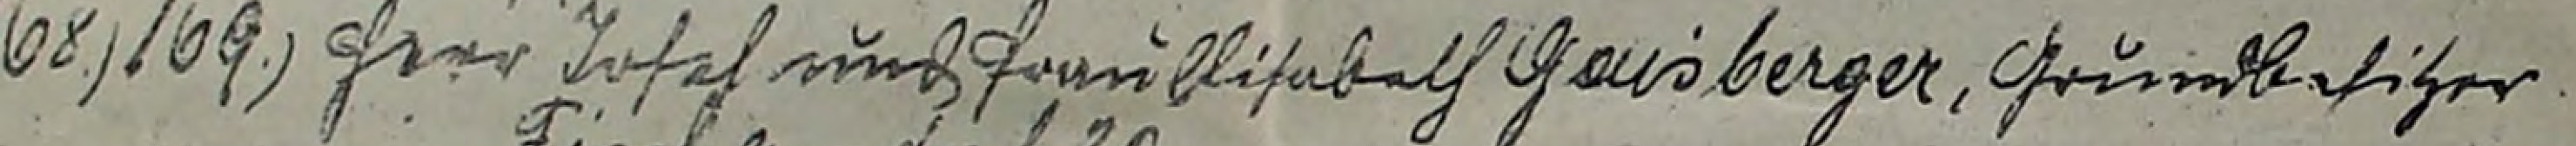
168.) 169.) Herr Josef und Frau Elisabeth Gaisberger, Grundbesitzer
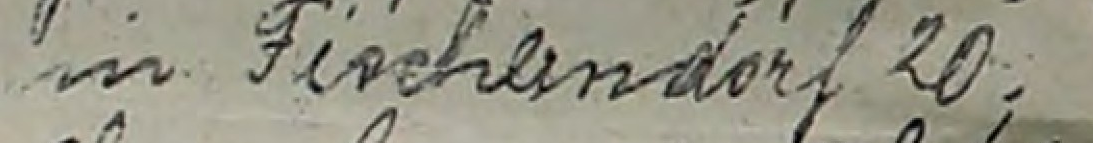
in Fischerndorf 20;
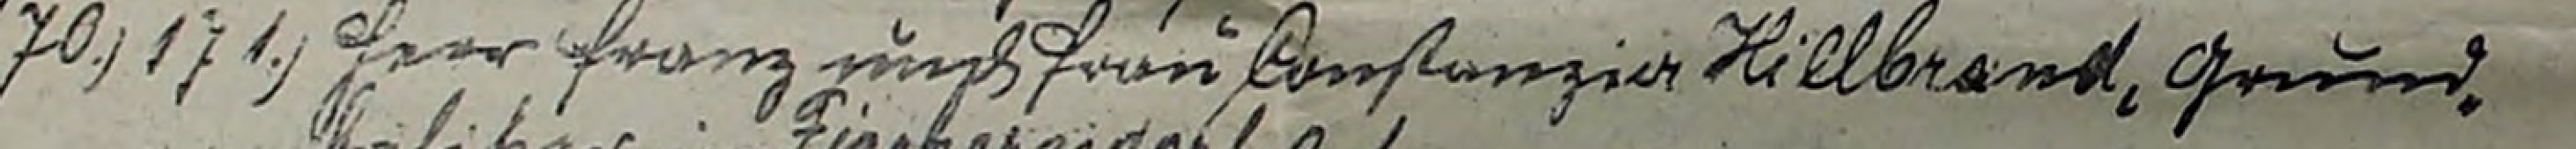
170.) 171.) Herr Franz und Frau Constanzia Hillbrand, Grund„
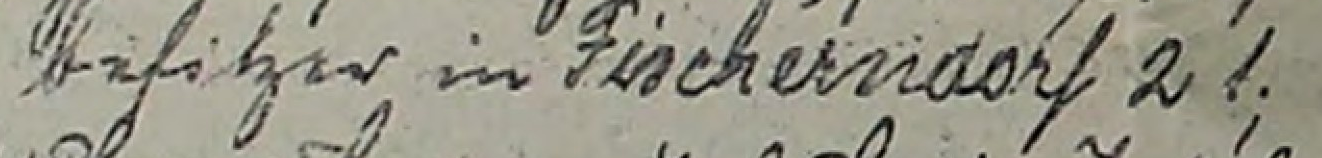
besitzer in Fischerndorf 21;
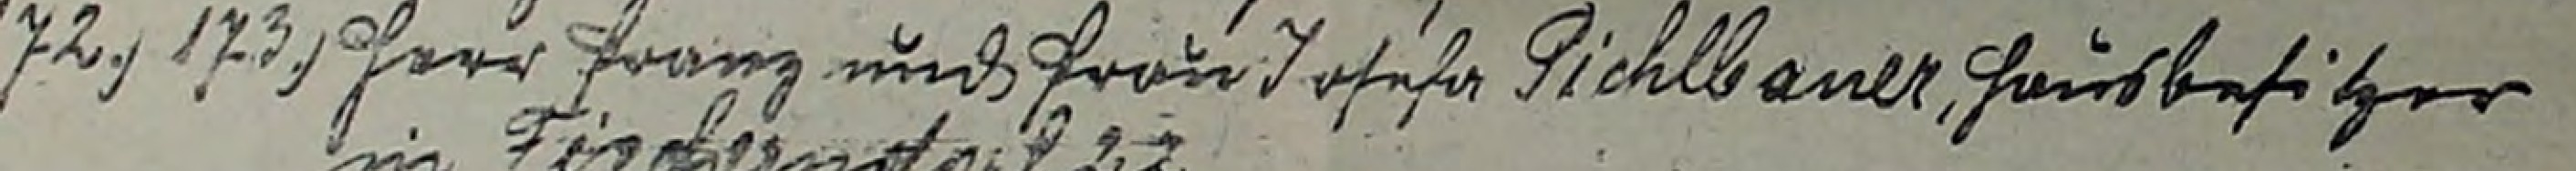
172.) 173.) Herr Franz und Frau Josefa Pichlbaner, Hausbesitzer
